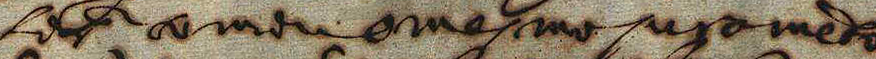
sor̄ tomou o mesmo juramēto
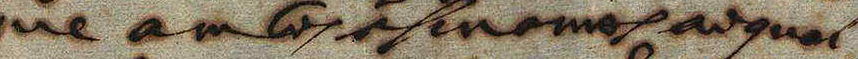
que ambos asenamos ao qual
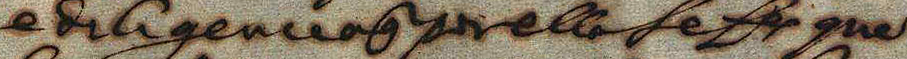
e diligencia q̄ por elle se fes que
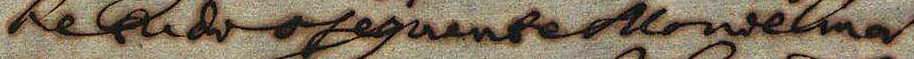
he tudo o seguinte Manoel mar
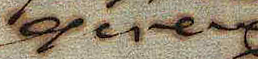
escreuj
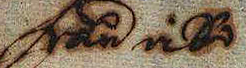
franco ribro
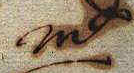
mdo
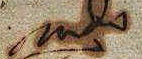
mdo
